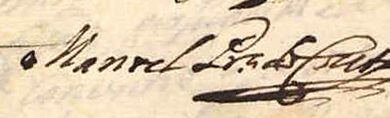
Manoel P.ra do Couto
